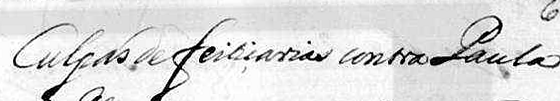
Culpas de feitiçarias contra Paula
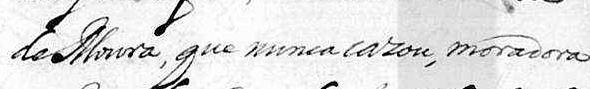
de Moura, que nunca cazou, moradora
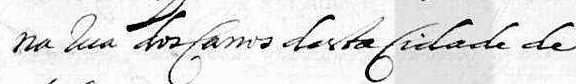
na Rua dos Canos desta Cidade de
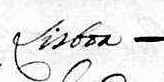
Lisboa -
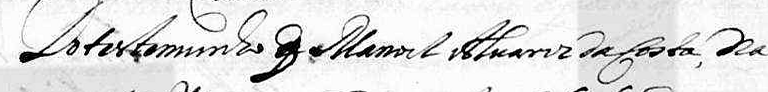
Do testemunho q̄ Manoel Aluarez da Costa, na
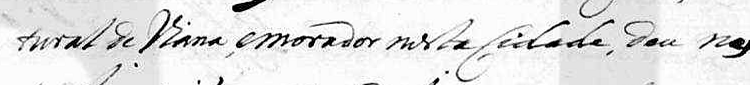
tural de Viana, e morador nesta Cidade, deu nes
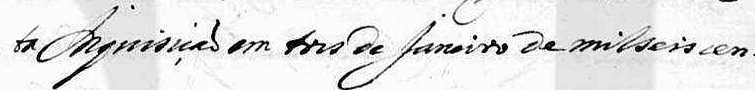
ta Inquisiçaõ em tres de Janeiro de mil seiscen
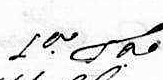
1.a Ta
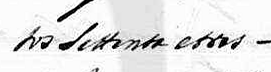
tos settenta e tres
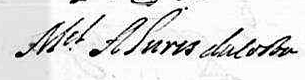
M.el Alures da Costa
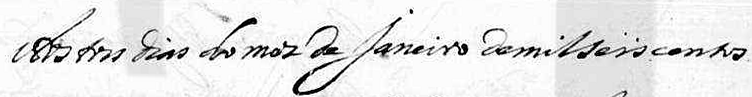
Aos tres dias do mez de Janeiro de mil seiscentos
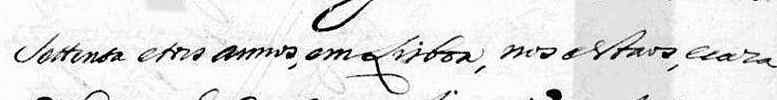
settenta e tres annos, em Lisboa, nos estaos, e caza
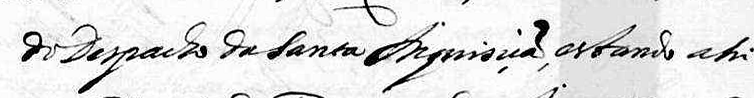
do Despacho da Santa Inquisiçaõ, estando ahi
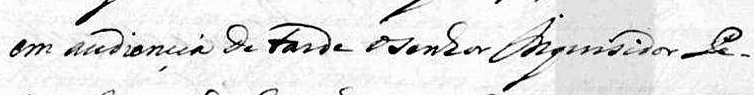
em audiencia de tarde o senhor Inquisidor Pe
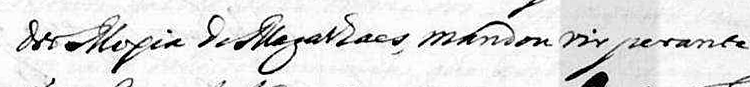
dro Mexia de Magalhaes, mandou vir perante
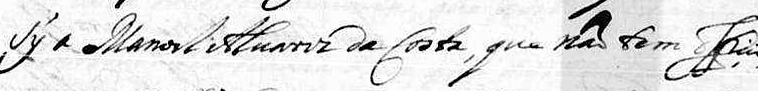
sy a Manoel Aluarez da Costa, que não tem officio
